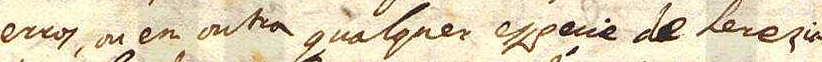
erros, ou em outra qualquer espeçie de herezia
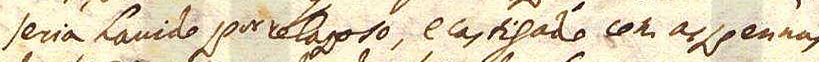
seria hauido por relapso, e castigado com as pennas
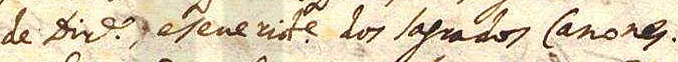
de Dir.to, e seuerid̄.e dos sagrados Canones.
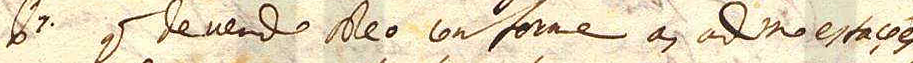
Pr. q̄ deuendo o Reo conforme as admoestaçoẽs,
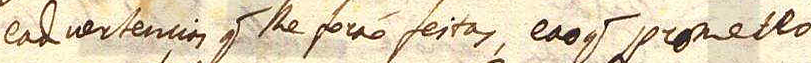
e aduertençias q̄ lhe foraõ feitas, e ao q̄ prometeo
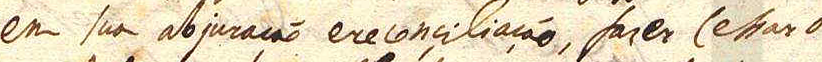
em sua abjuraçaõ e reconçiliaçaõ, fazer Cessar o
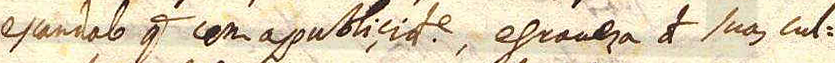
escandalo q̄ com a publiçid̄.e, e graueza d̄ suas cul
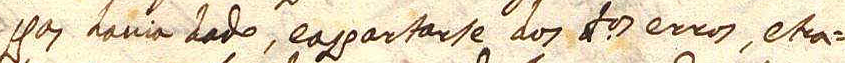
pas hauia dado, e apartarse dos d̄.os erros, e tra
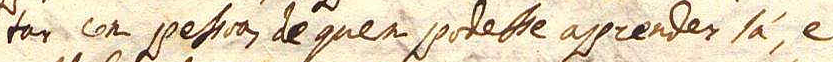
tar com pessoas de quem podesse aprender sā, e
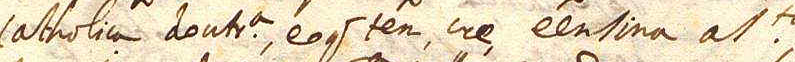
catholica doutr.a, e o q̄ tem, cre, e ensina a Sta.
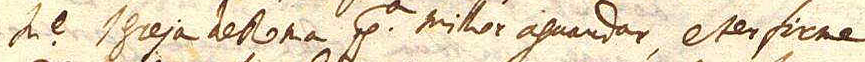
Me. Igreja de Roma p.a milhor aguardar, e ter firme
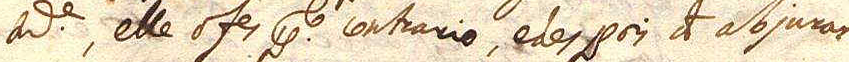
tu.de, elle o fes p.lo contrario, e despois d̄ abjurar
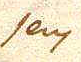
seus
